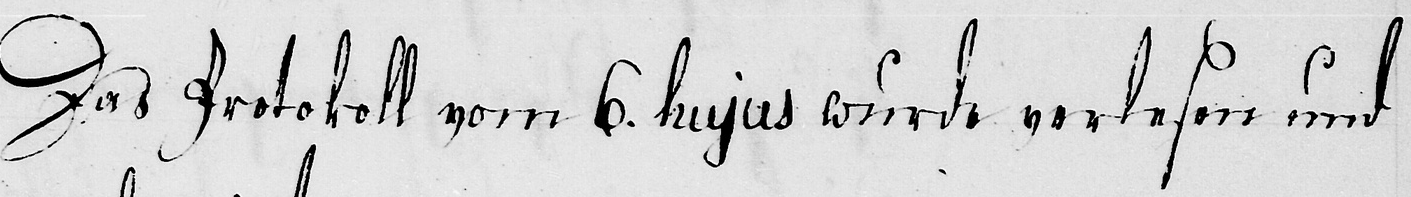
Das Protokoll vom 6. hujus wurde verlesen und
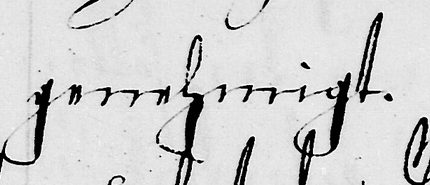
genehmigt.
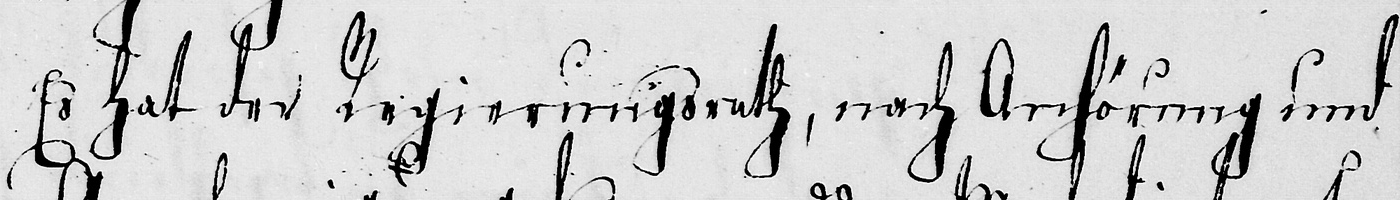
Es hat der Regierungsrath, nach Anhörung und
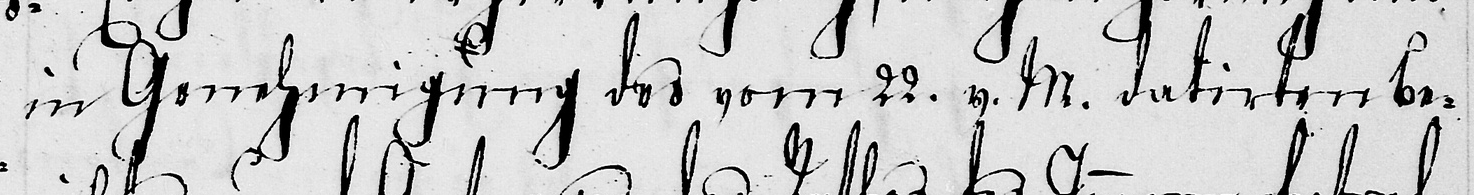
in Genehmigung des vom 22 v. M. datirten Be¬
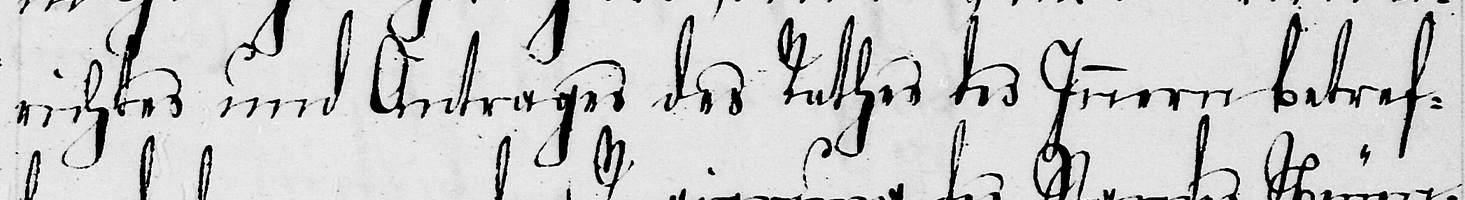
richtes und Antrages des Rathes des Innern betref¬
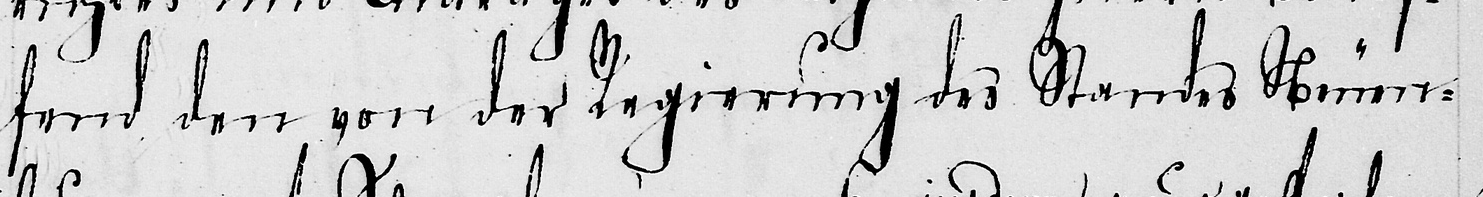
fend den von der Regierung des Standes Neuen¬
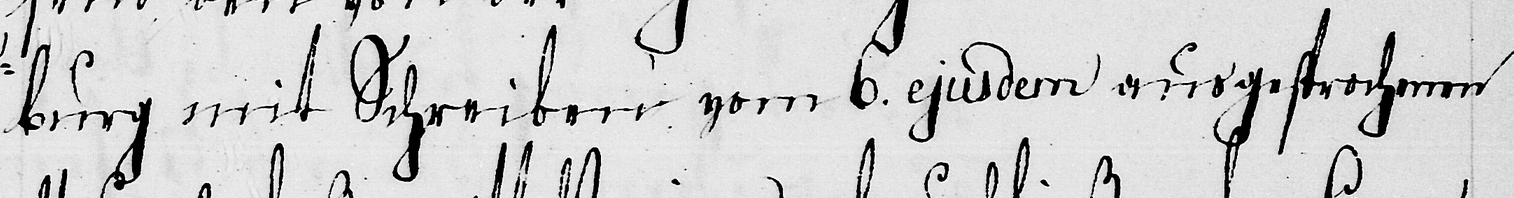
burg mit Schreiben vom 6. ejusdem ausgesprochenen
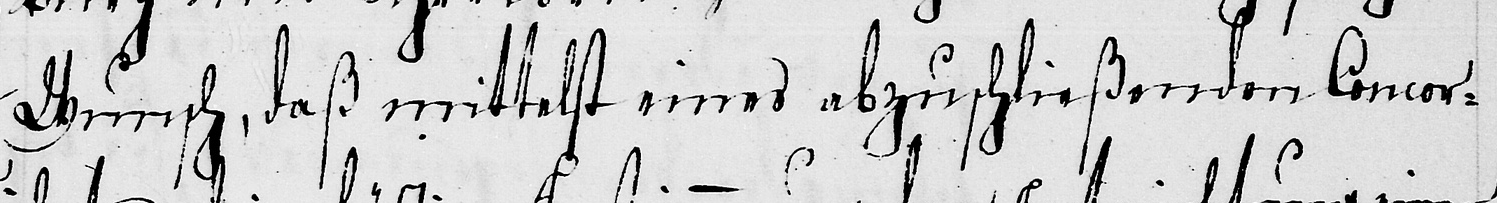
Wunsch, daß mittelst eines abzuschließenden Concor¬
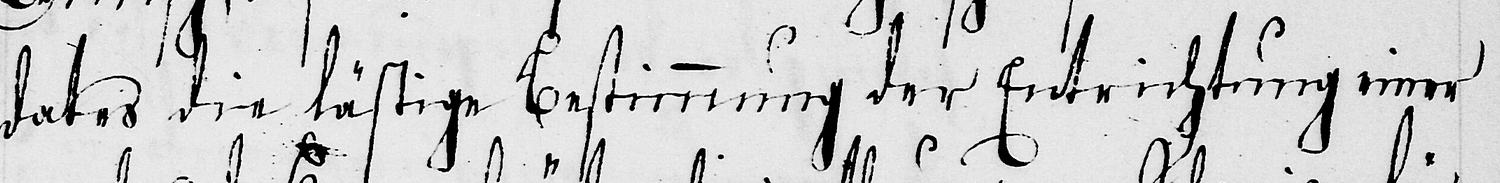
dates die lästige Bestimmung der Entrichtung einer
